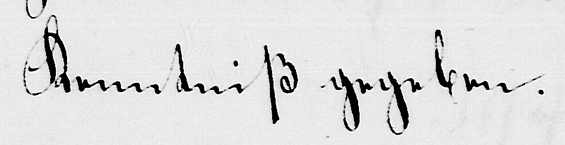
Kenntniß gegeben.
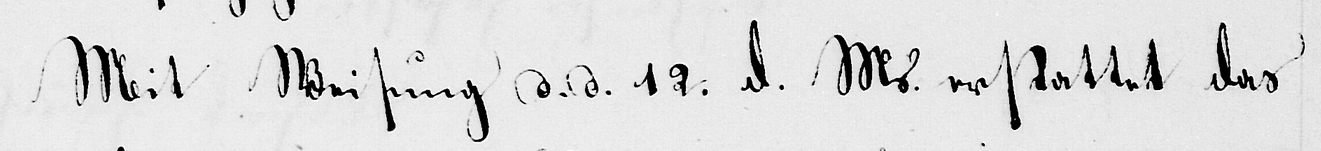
Mit Weisung d. d. 12. d. Ms. erstattet das
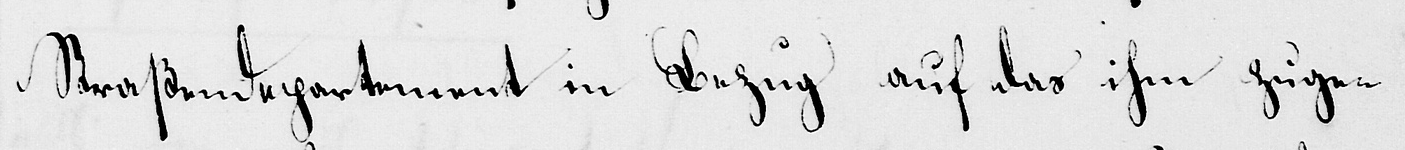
Straßendepartement in Bezug auf das ihm zuge¬
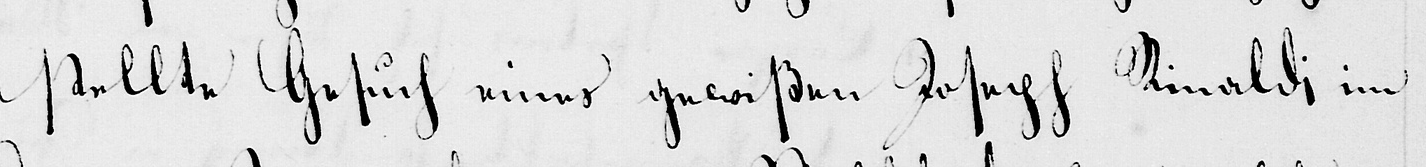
stellte Gesuch eines gewißen Joseph Rinaldi im
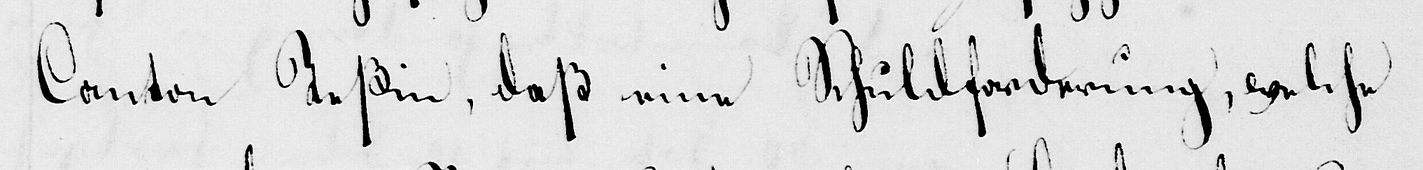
Canton Teßin, daß eine Schuldforderung, welche
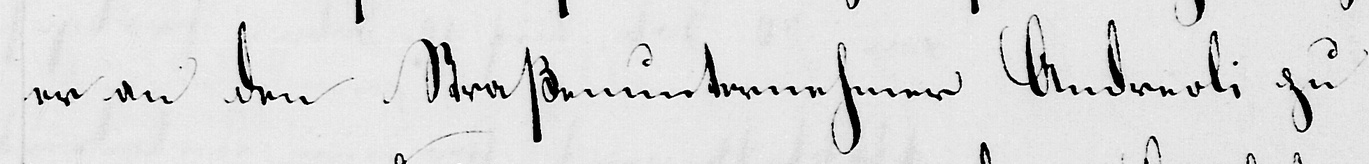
er an den Straßenunternehmer Andreolli zu
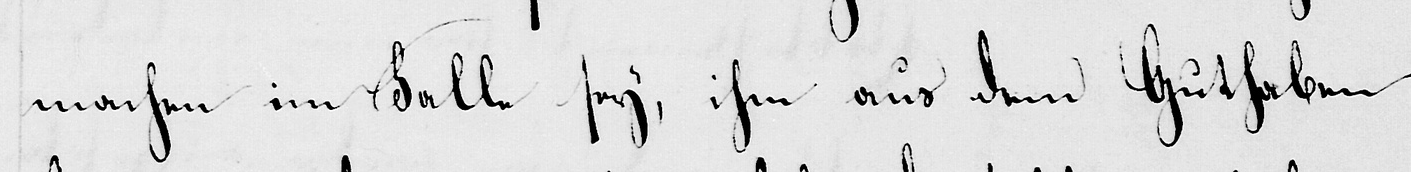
machen im Falle sey, ihm aus dem Guthaben
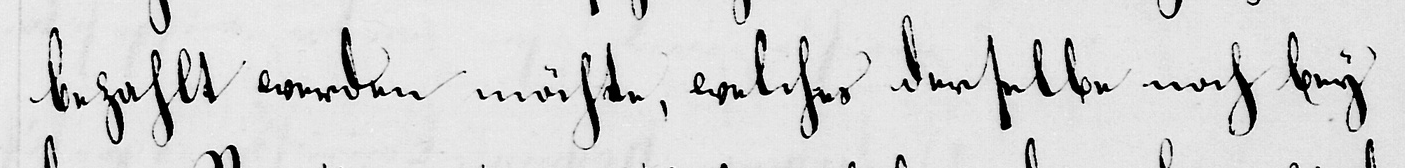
bezahlt werden möchte, welches derselbe noch bey
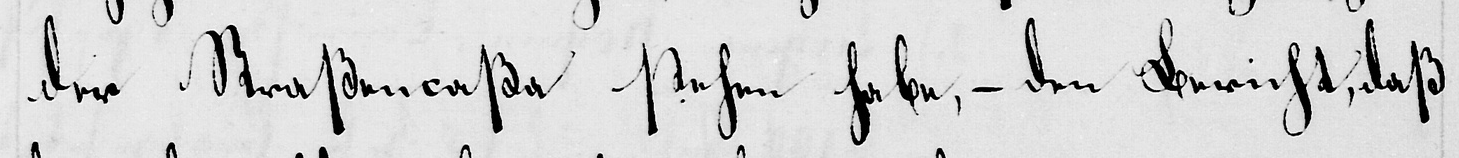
der Straßencaßa stehen habe, – den Bericht, daß
